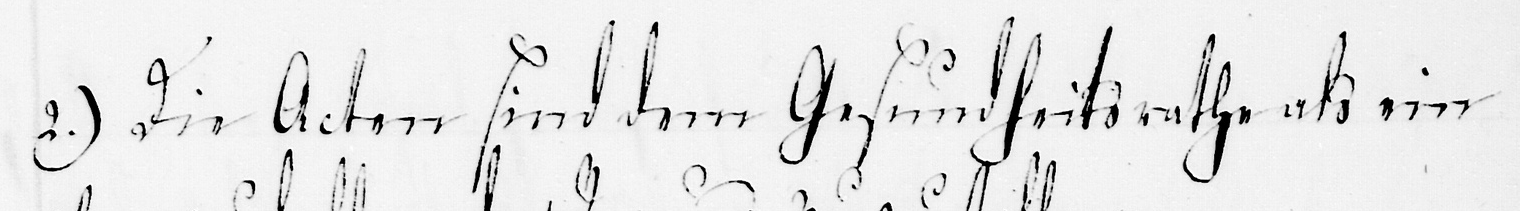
2.) Die Acten sind dem Gesundheitsrathe als ein
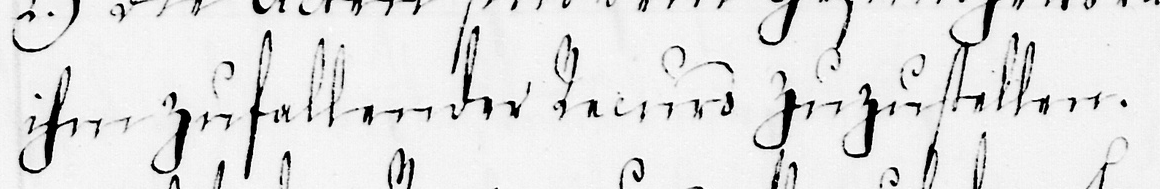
ihm zufallender Recurs zuzustellen.
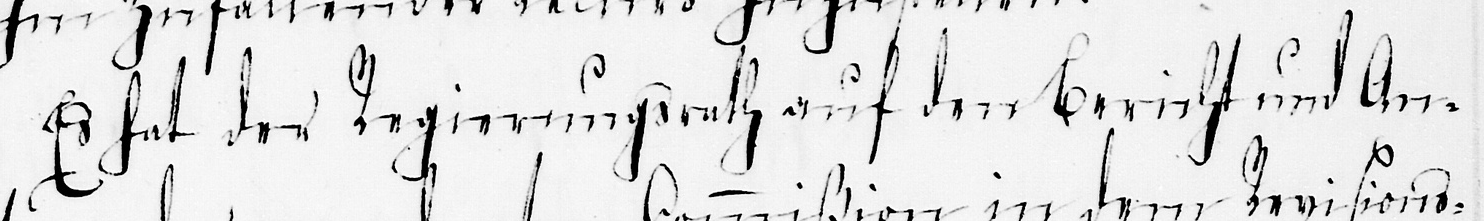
Es hat der Regierungsrath auf den Bericht und An¬
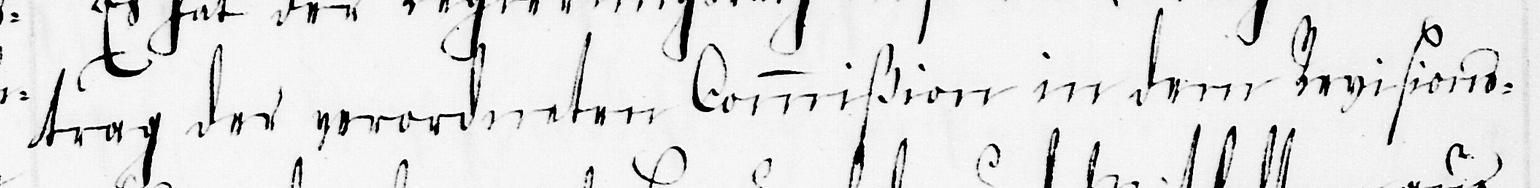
trag der verordneten Commißion in dem Revisions¬
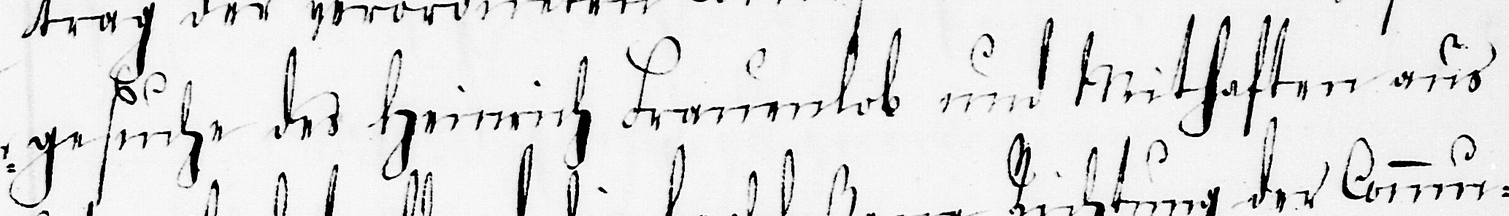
gesuche des Heinrich Frauenlob und Mithaften aus
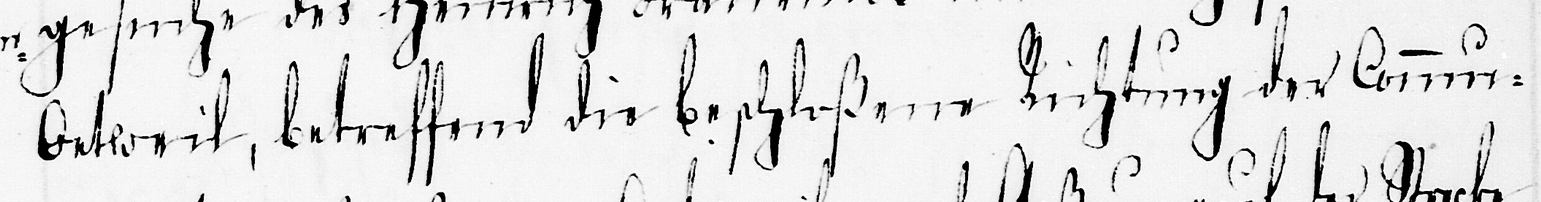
Oetweil, betreffend die beschloßene Richtung der Comm¬
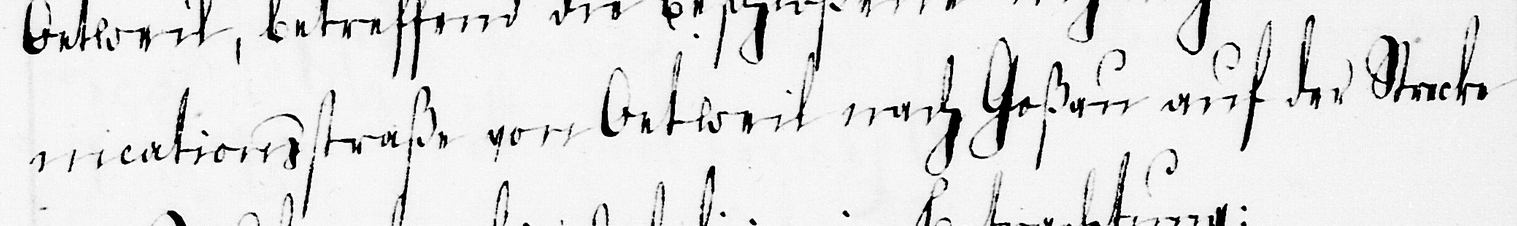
unicationsstraße von Oetweil nach Goßau auf der Strecke
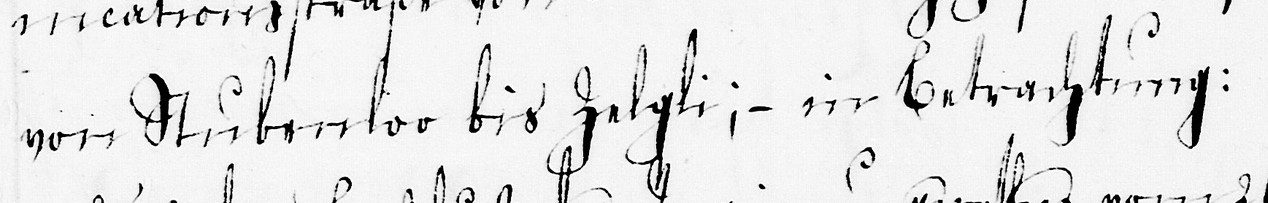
von Stubenloo bis Zelgli; – in Betrachtung:
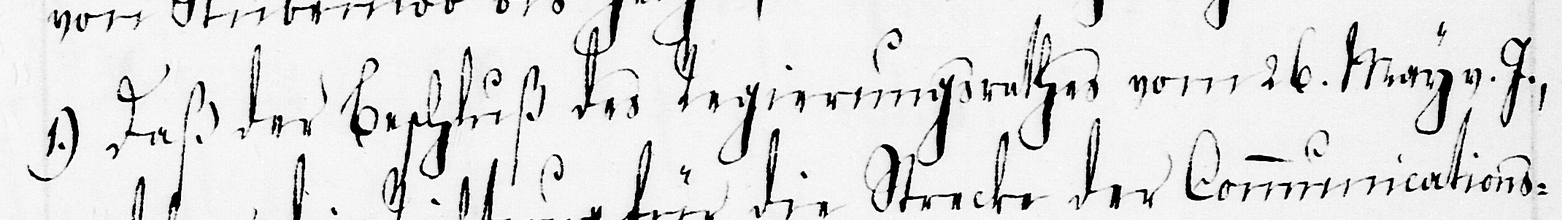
1.) Daß der Beschluß des Regierungsrathes vom 26. May v. J.,
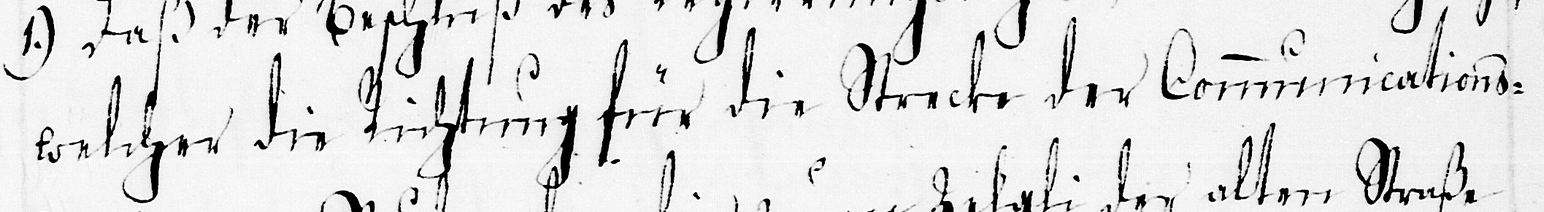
welcher die Richtung für die Strecke der Communications¬
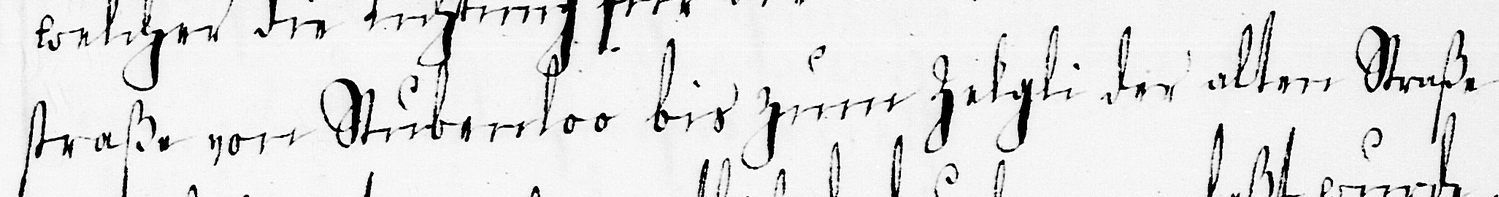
straße von Stubenloo bis zum Zelgli der alten Straße
